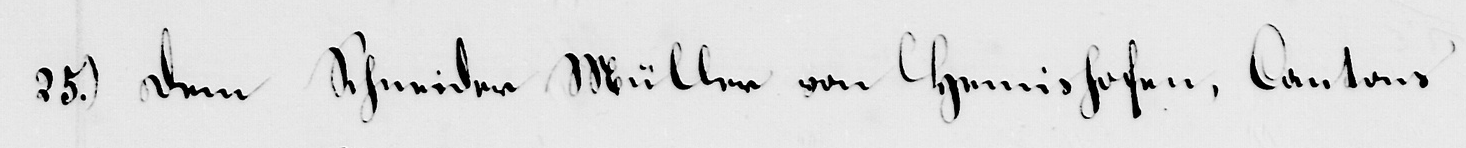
25.) " Schneider Müller von Hemishofen, Cantons
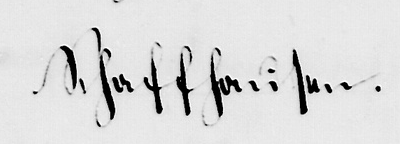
Schaffhausen.
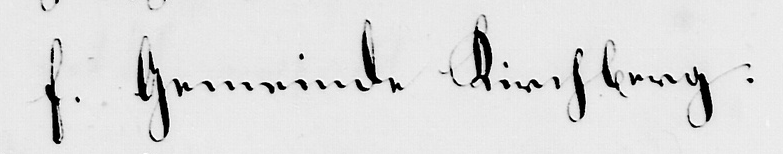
f. Gemeinde Kirchberg.
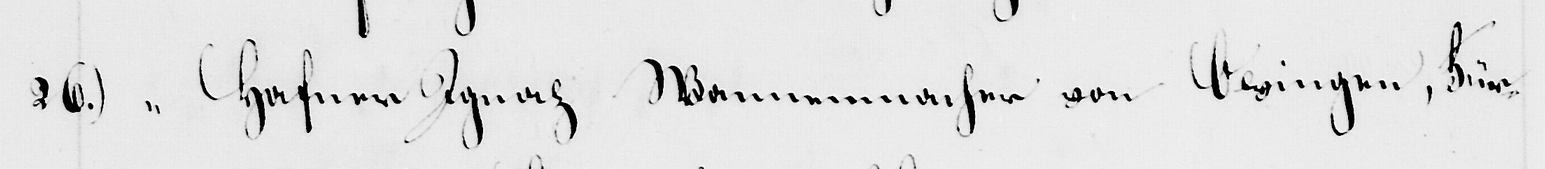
26.) " Hafner Ignaz Wannenmacher von Owingen, Für¬
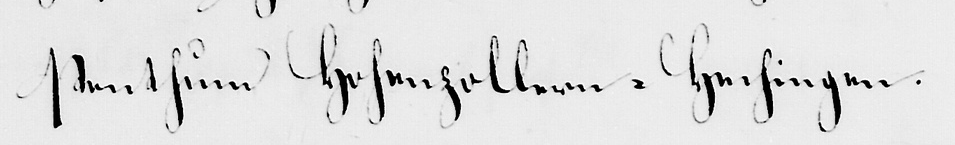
stenthum Hohenzollern-Hechingen.
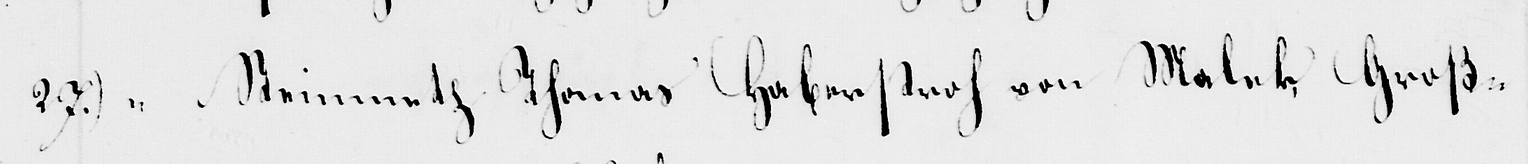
27.) " Steinmetz Thomas Haberstroh von Malek, Groß¬
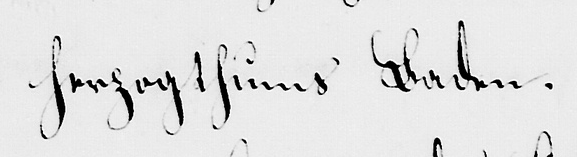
herzogthums Baden.
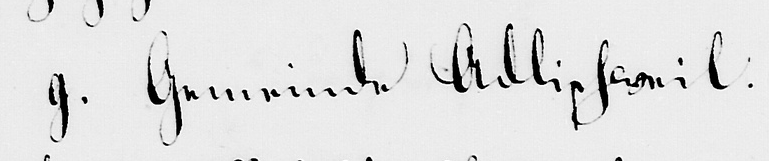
g. Gemeinde Adlischweil.
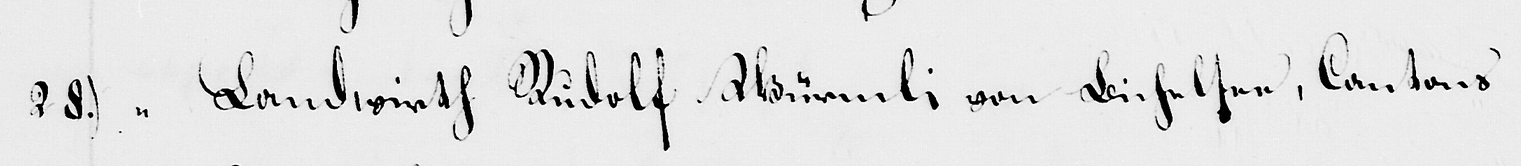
28.) " Landwirth Rudolf Würmli von Bichelsee, Cantons
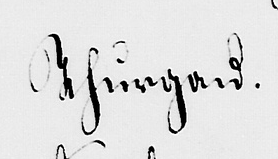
Thurgau.
